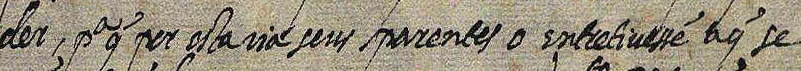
der, pa q̄ per esta via seus parentes o Entretiuessē a q̄ se
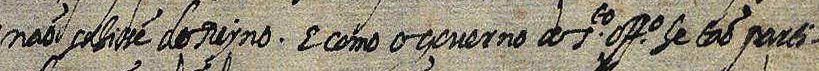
naõ sahissē do Reyno. E como o gouerno do s.to offo. he tão parti
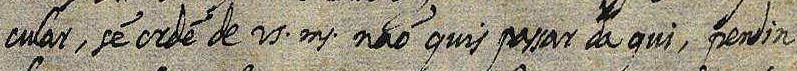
cular, sē ordē de vs. ms. naõ quis passar daqui, pendin
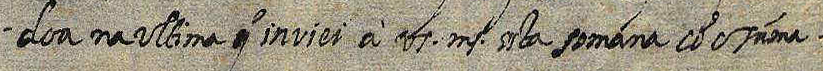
doa na vltima q̄ inviei à vs. ms. Esta somana cō o sūma
